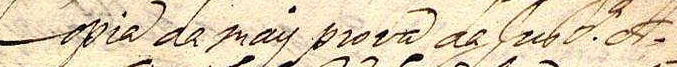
Copia da mais prova da Just.a A.
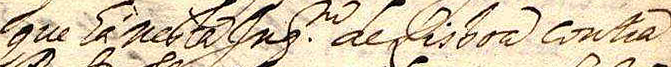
que há nesta Jnq.m de Lisboa contra
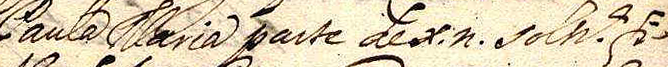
Paua Maria parte de x. n. soltr.a fi
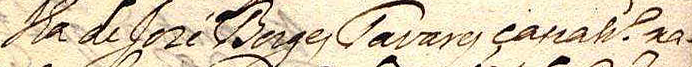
lha de Jozé Borges Tavares çapatr.o na
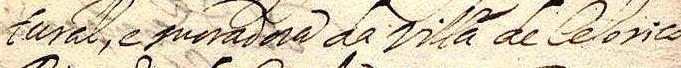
tural, e moradora da villa de Celorico
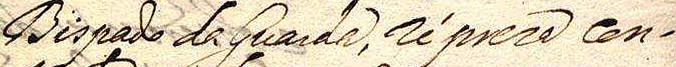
Bispado da Guarda, Ré preza con
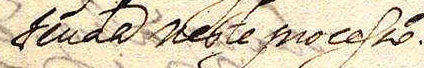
teuda neste processo.
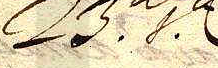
23.a t.a
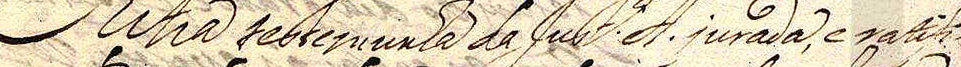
Outra testemunha da Just.a A. jurada, e ratifi
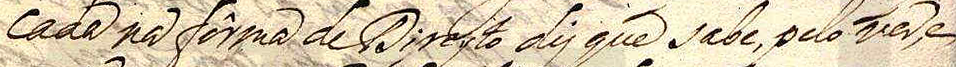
cada na fôrma de Direyto dis que sabe, pelo ver, e
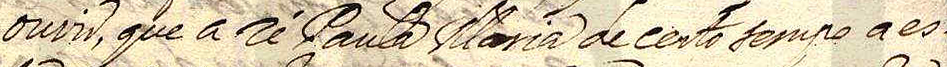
ouvir, que a Ré Paula Maria de certo tempo a es
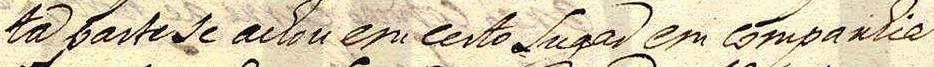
ta parte se achou em certo Lugar em companhia
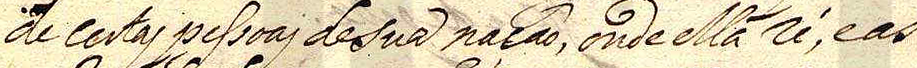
de certas pessoas de sua naçaõ, onde ella Ré, e as
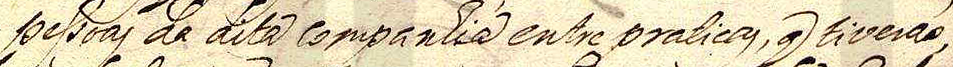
pessoas da dita companhia entre praticas, q̄ tiveraõ,
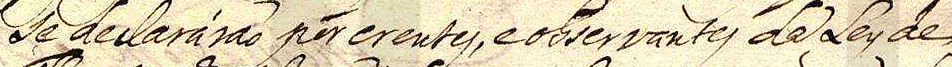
se declaráraõ por crentes, e observantes da Ley de
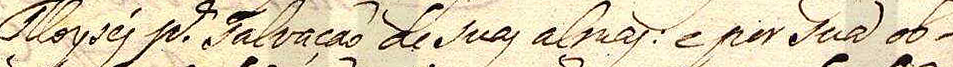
Moysés p.a salvaçaõ de suas almas: e por sua ob
